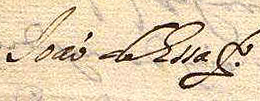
Ioaõ de Essa f.o
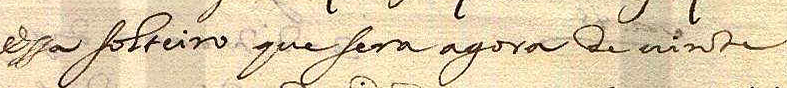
essa solteiro que sera agora de uinte
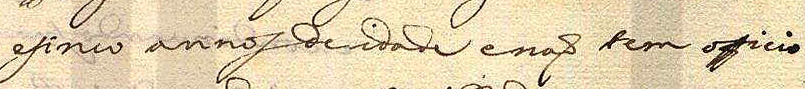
e sinco annos de idade e naõ tem officio
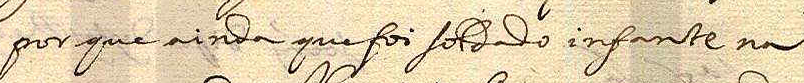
porque ainda que foi soldado infante na
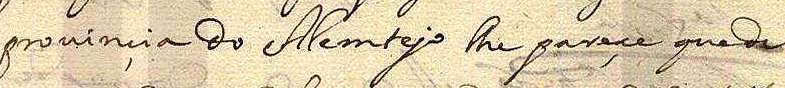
prouincia do Alentejo lhe parece que de
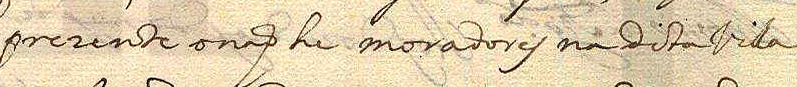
prezente o naõ he moradores na dita villa
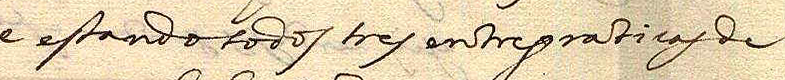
e estando todos tres entre praticas de
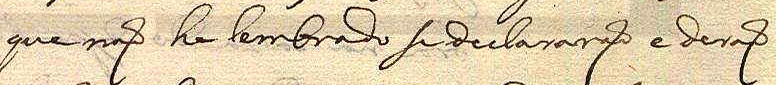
que naõ he lembrado se declararaõ e deraõ
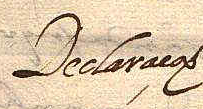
Declaraçaõ
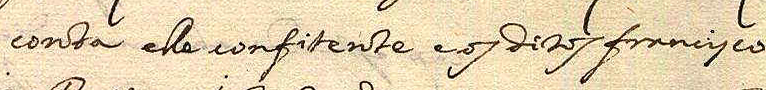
conta elle confitente e os ditos francisco
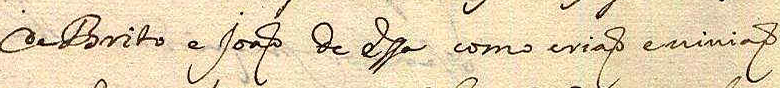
de Brito e joaõ de essa como criaõ e uiuiaõ
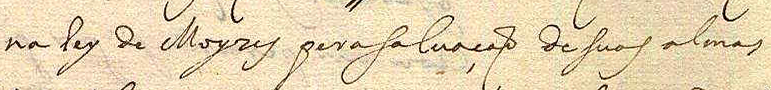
na ley de Moyzes pera saluaçaõ de suas almas
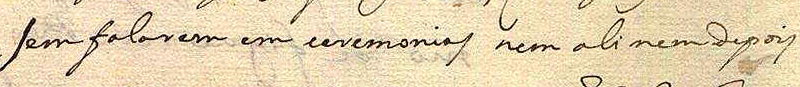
sem falarem em ceremonias nem ali nem depois
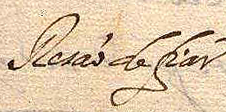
Resaõ de fiar
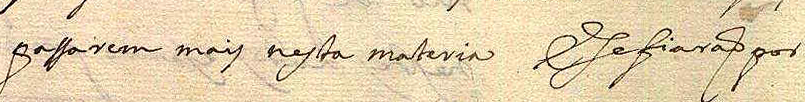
passarem mais nesta materia E se fiaraõ por
